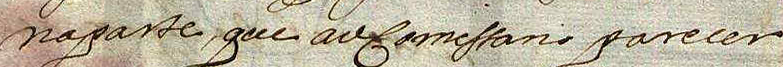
na parte, que ao Comissario parecer
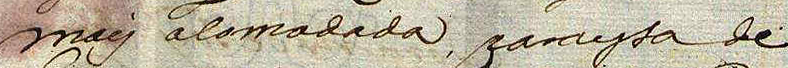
mais acomodada, para esta de
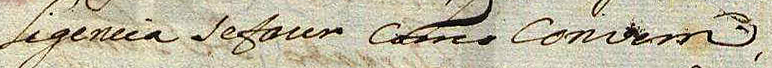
Ligencia se fazer como convem,
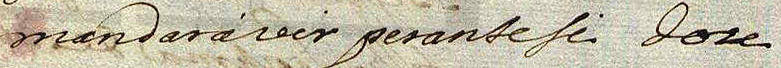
mandará vir perante si doze
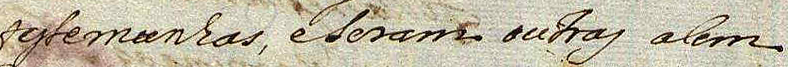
testemunhas, e seram outras alem
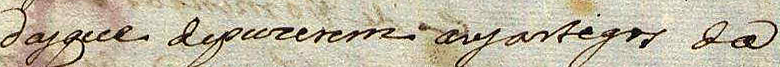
das que depuzerem aos artigos da
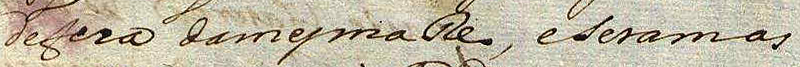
defeza da mesma Re, e seram as
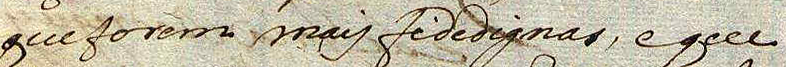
que forem mais fidedignas, e que
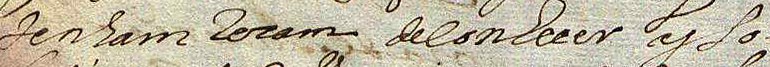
tenham Rezam de conhecer as so
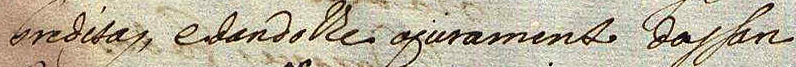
breditas, e dandolhe o juramento dos san
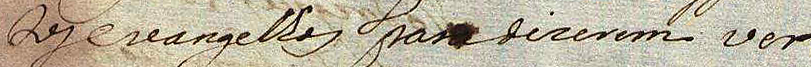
tos evangelhos para dizerem ver
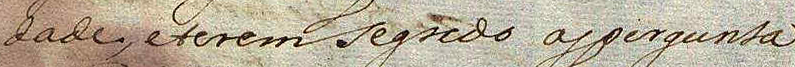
dade, e terem segredo as pergunta
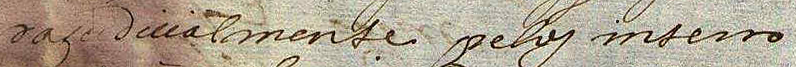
ra judicialmente pelos interro
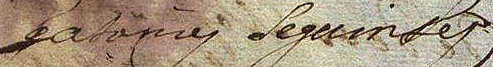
gatorios seguintes
